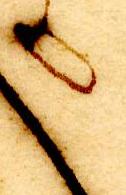To
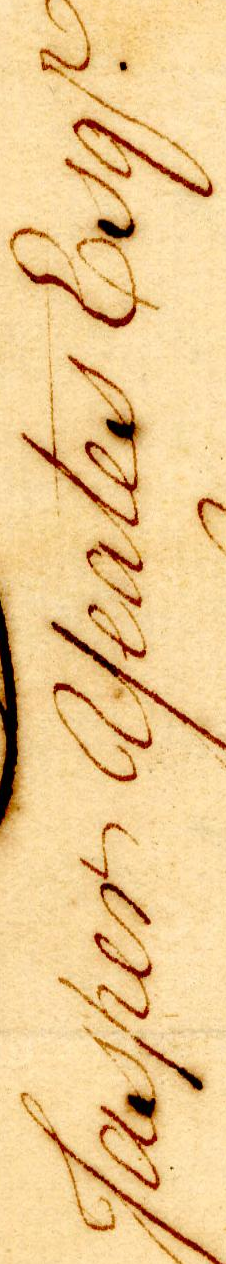Jasper Yeates Esq^r.
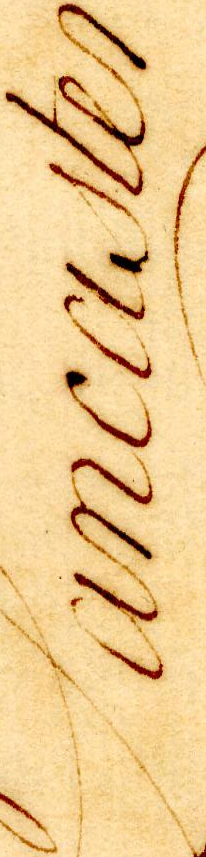Lancaster
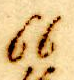66
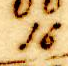16
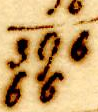396
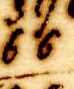66
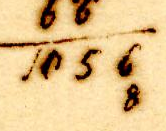1056
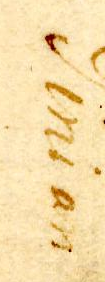Tinian
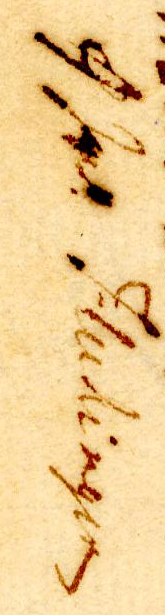Per Jos^h. Fleekinger
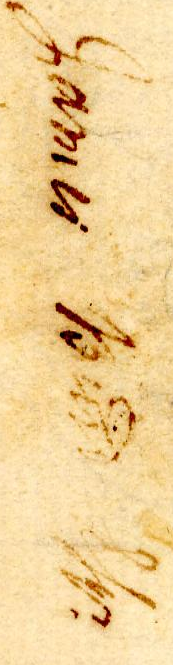James Burd Esq^r.
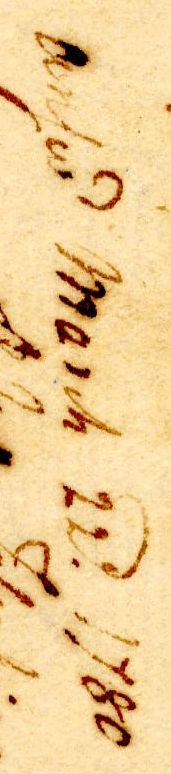Answ^d March 22^d. 1780
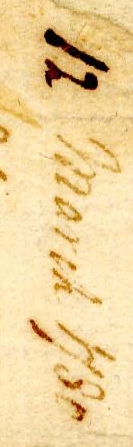12 March 1780
